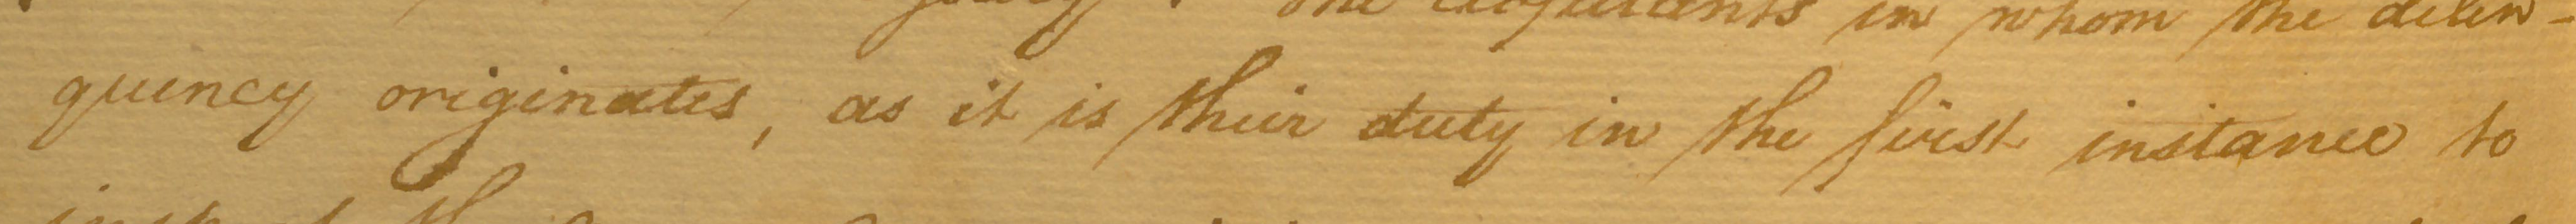quincy originates, as it is their duty in the first instance to
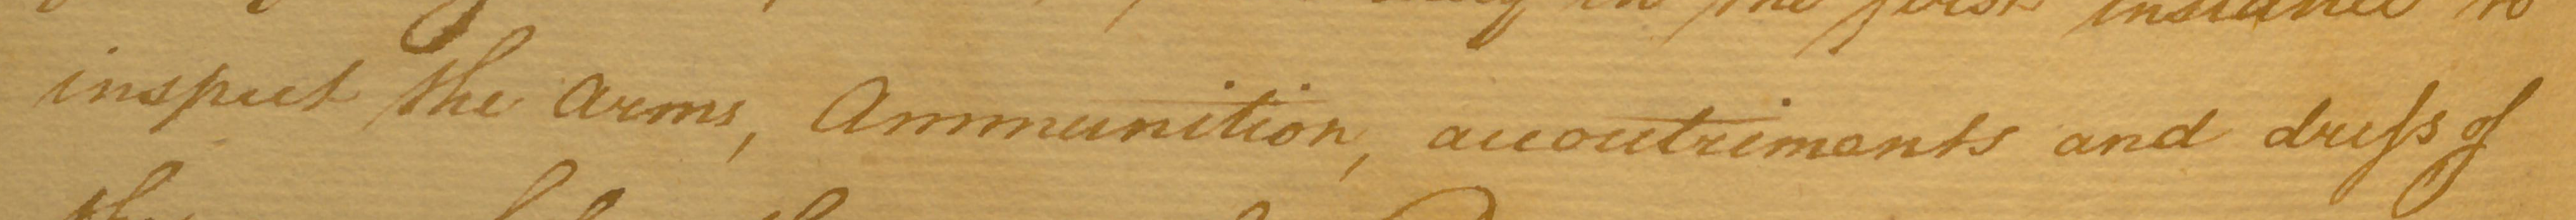inspect the Arms, Ammunition, accoutriments and dress of
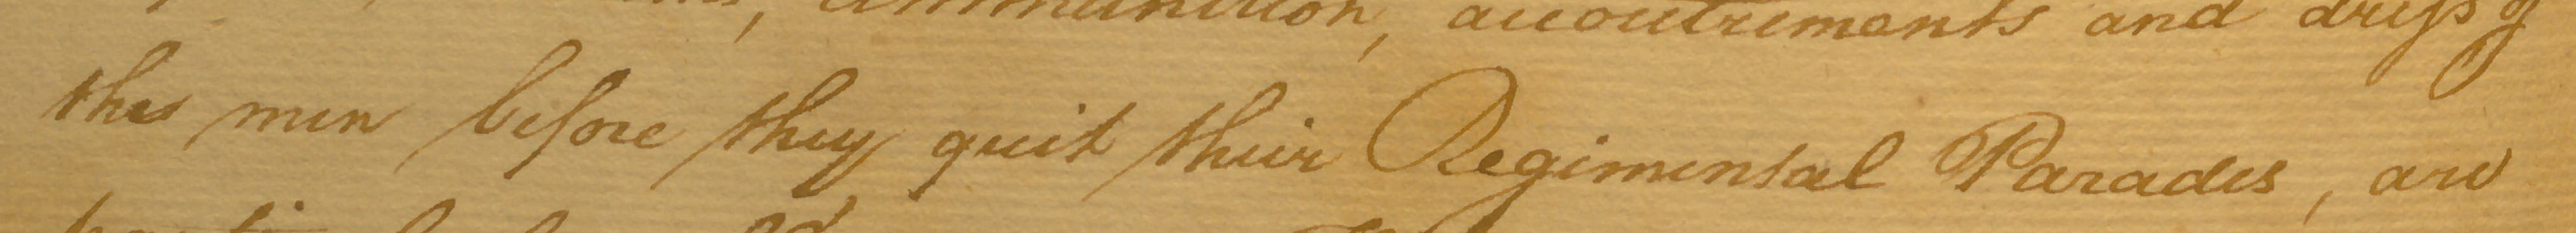the men before they quit their Regimental Parades, and
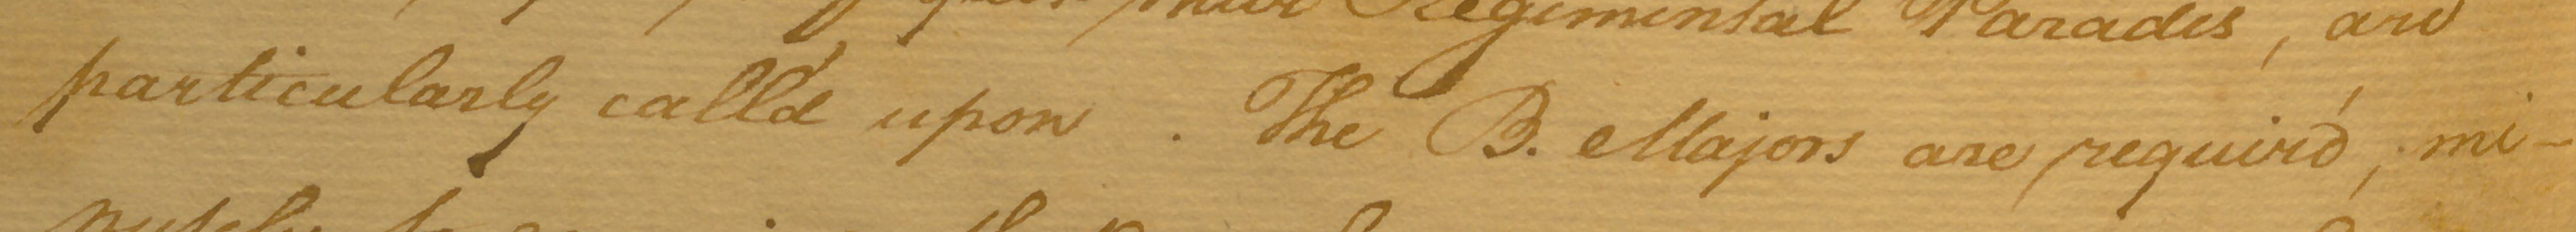particularly call'd upon. The B. Majors are requi'rd, mi-
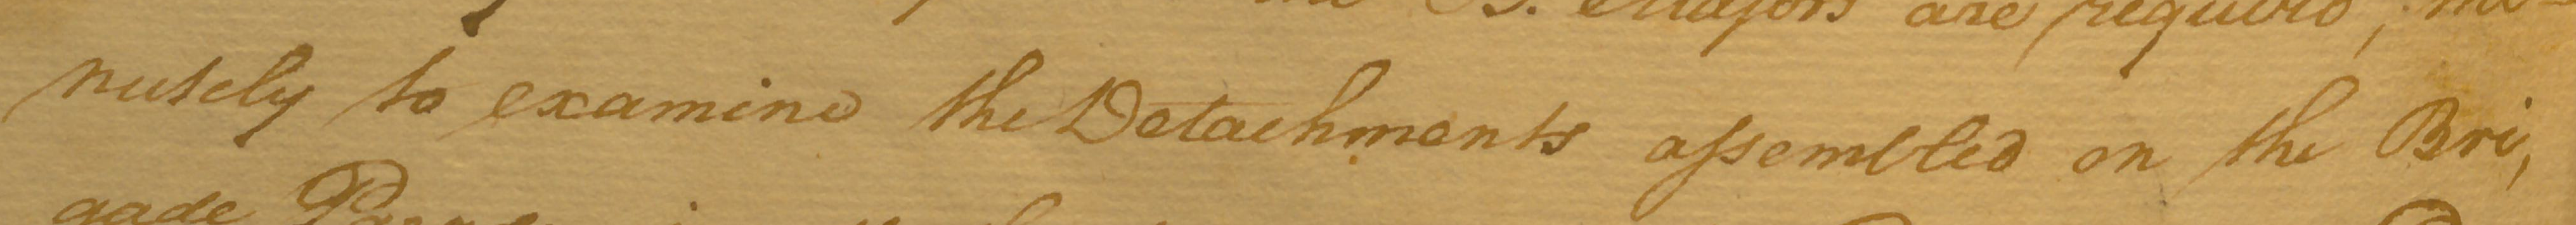nutely to examine the Detachments assembled on the Bri-
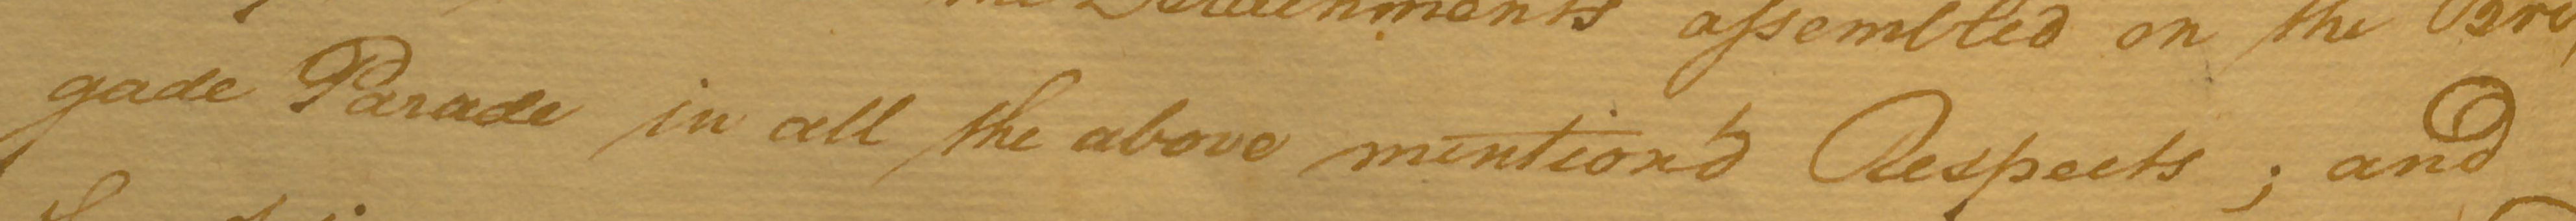gade Parade in all the above mention'd Respects; and
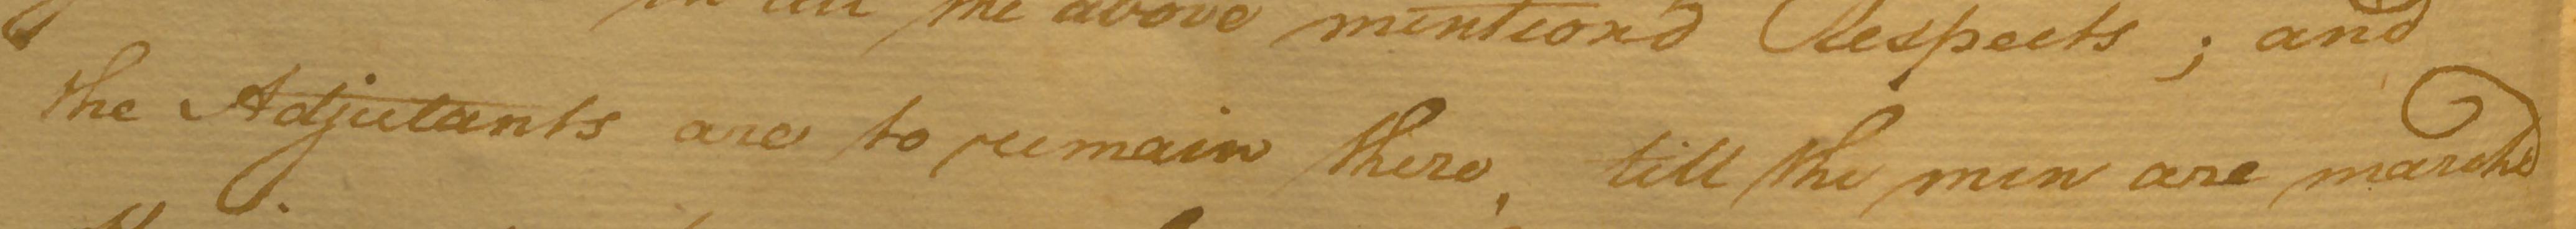the Adjutants are to remain there, till the men are marchd
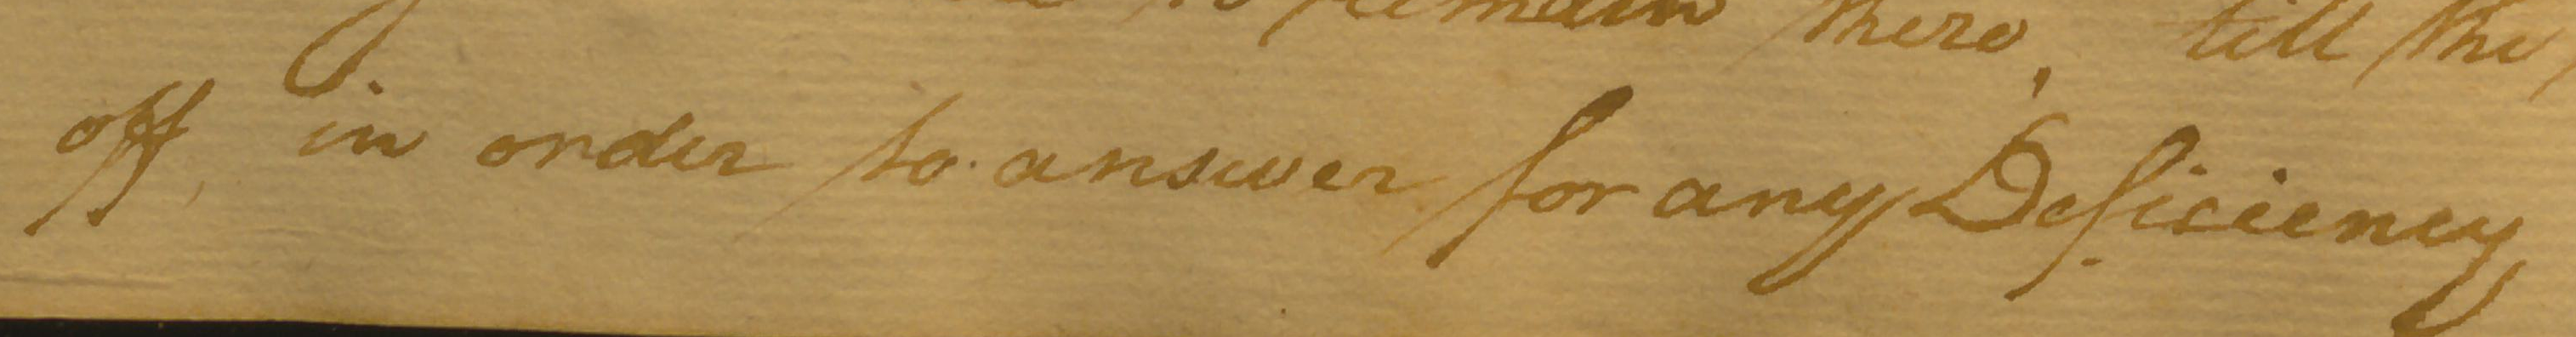off, in order to answer for any Deficiency
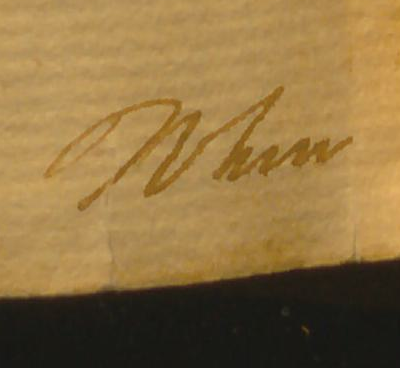When
